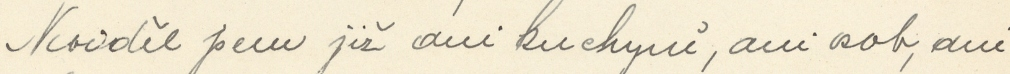Neviděl jsem již ani kuchyně, ani osob, ani
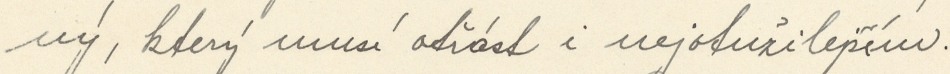ný, který musí otřást i nejotužilejším.
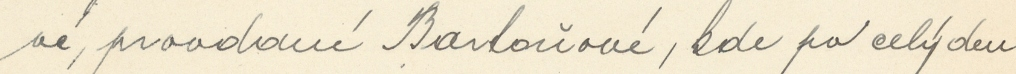vé, provdané Bartoňové, kde po celý den
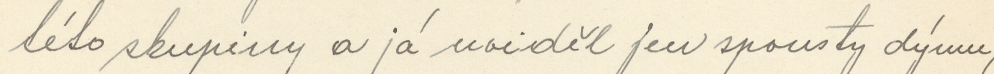této skupiny a já uviděl jen spousty dýmu,
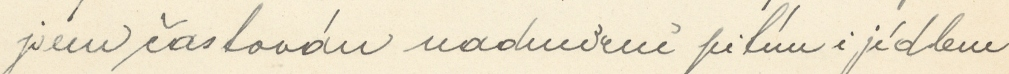jsem častován nadměrně pitím i jídlem
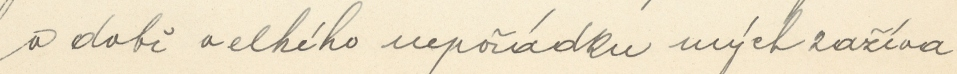v době velkého nepořádku mých zažíva-
